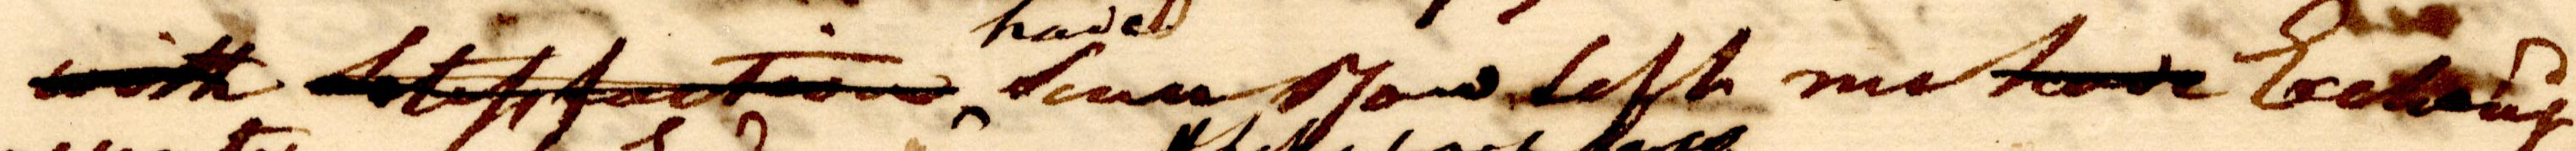[with] [satisfaction] ^ since you left me [here] Exactly
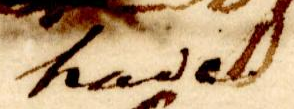have
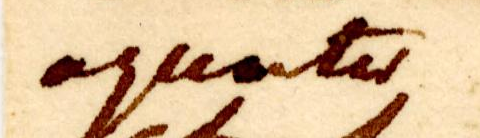against
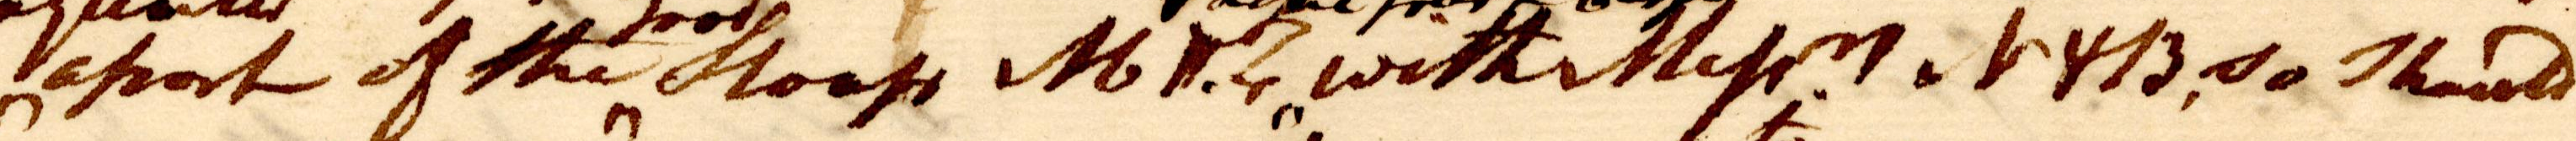a part of the ^ Sloops M F ^ with Mess^n. N & B so should
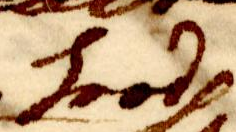Good
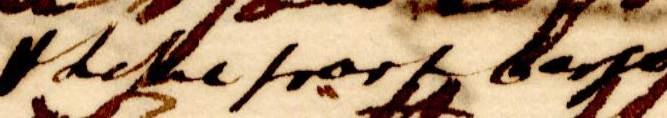left port cargo
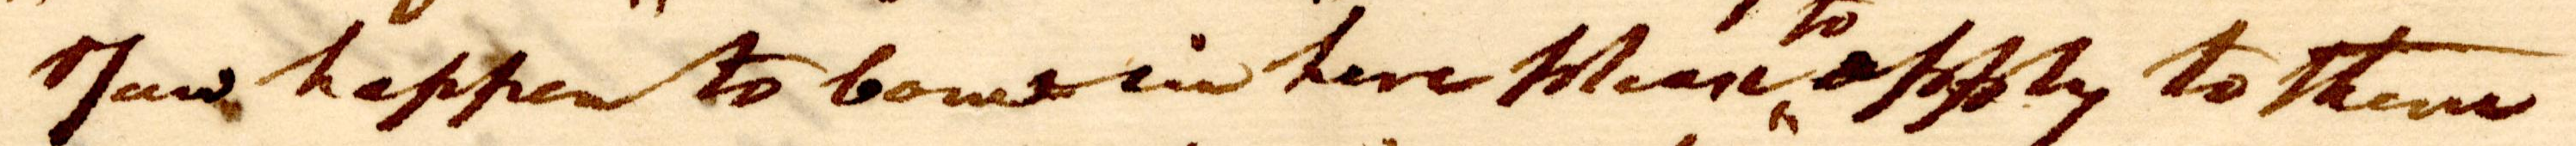you happen to care in here please apply to there
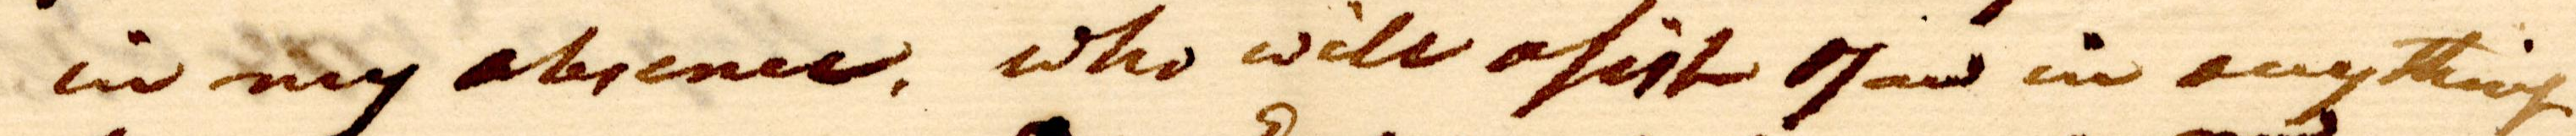in my absence, who will assist you in anything
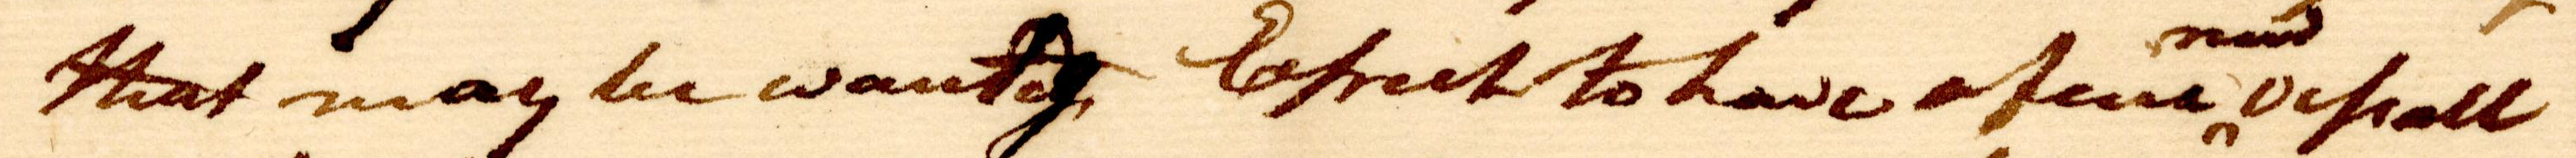that may be wanted Expect to have a few ^ vessall
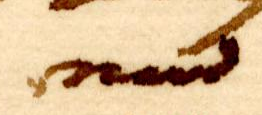new
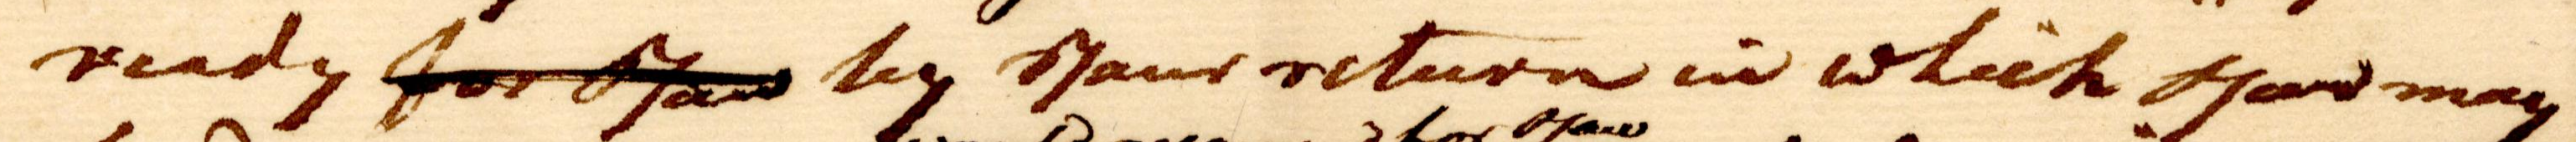ready [for you] by your return in which you may
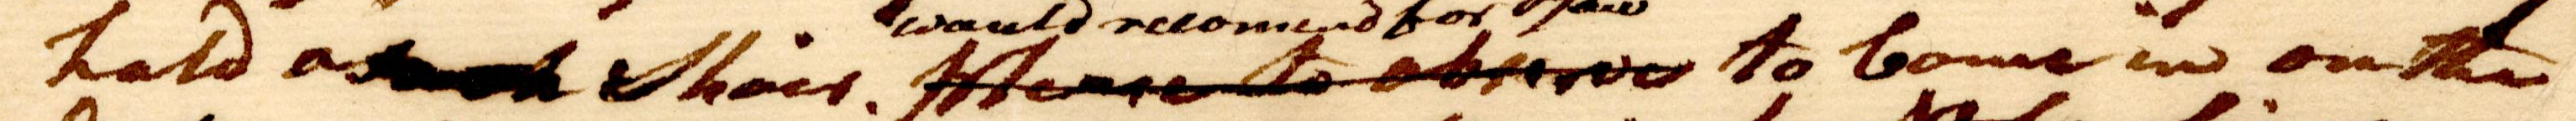hold [___] Shairs. [please to observe] to Come in on the
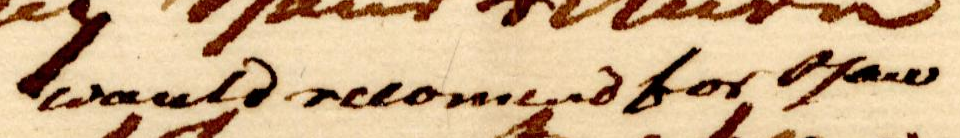would recomend for you
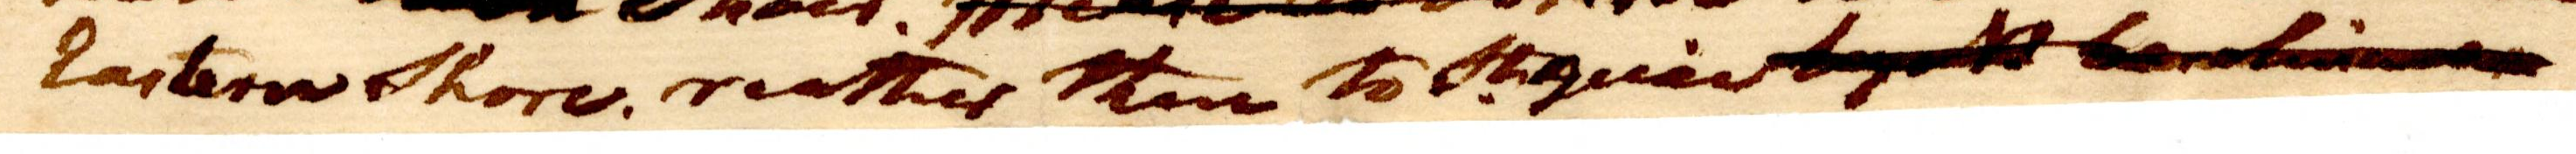Eastern Shore neither them to give [_____] [______]
